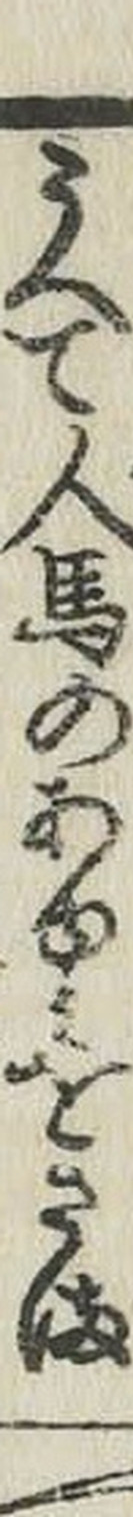うへて人馬のあゆみをさま
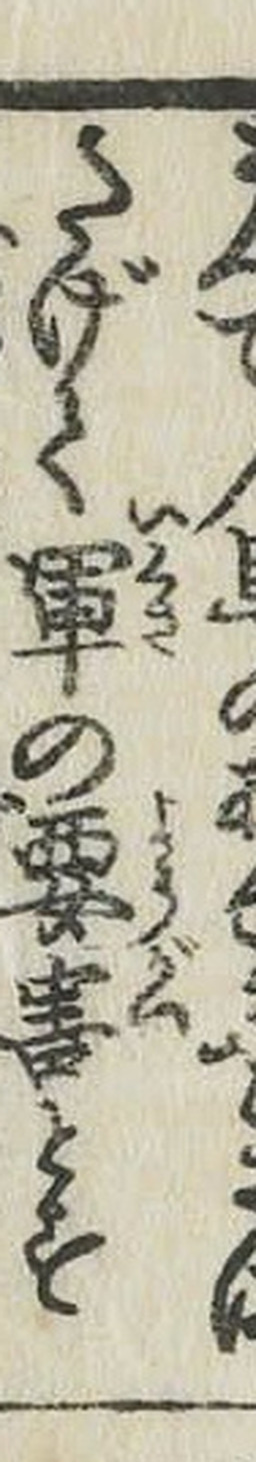たげて軍の要害とす
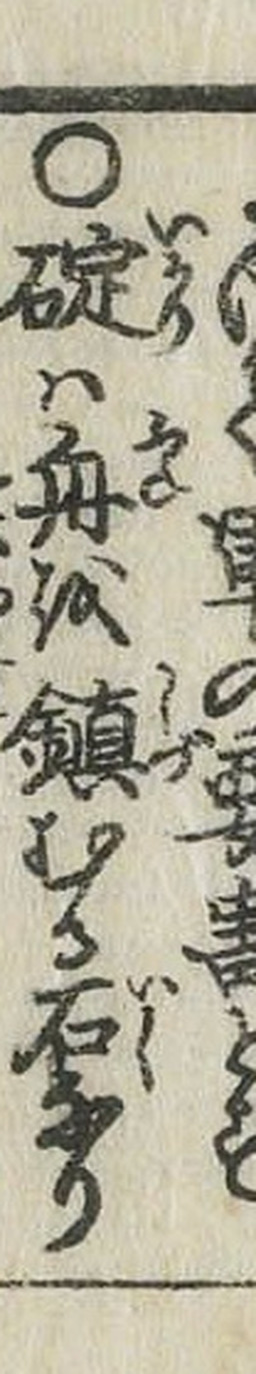○碇は舟を鎮むる石なり
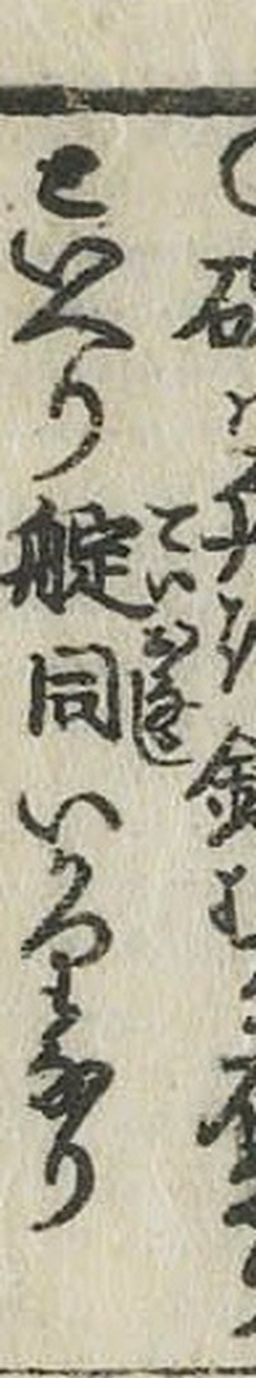といへり𦩘同いかりなり

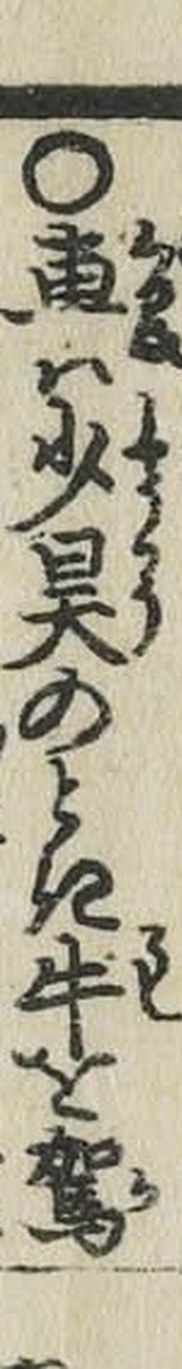○車は少昊のとき牛を駕
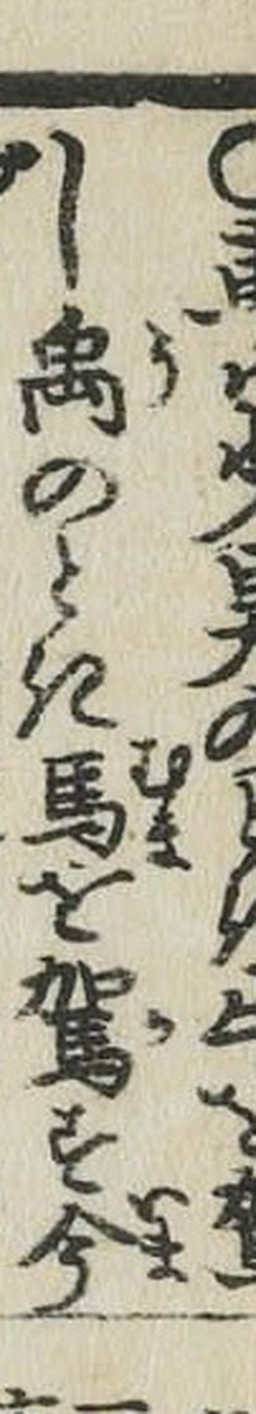し禹のとき馬を駕す今
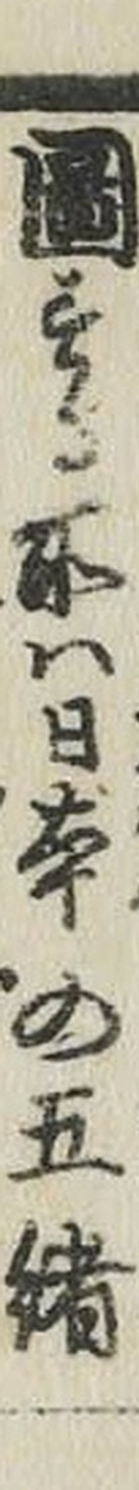図する所は日本の五緒
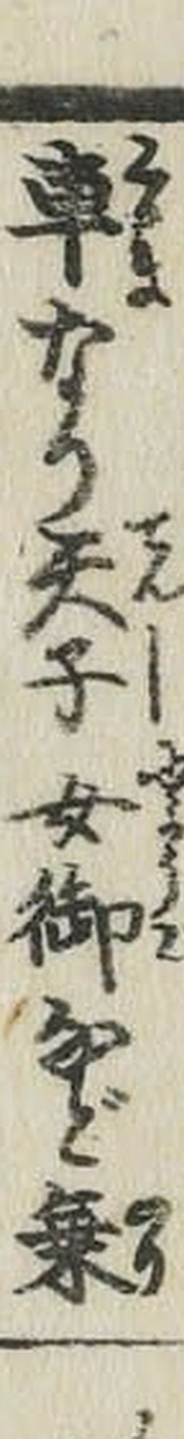車なり天子女御など乗
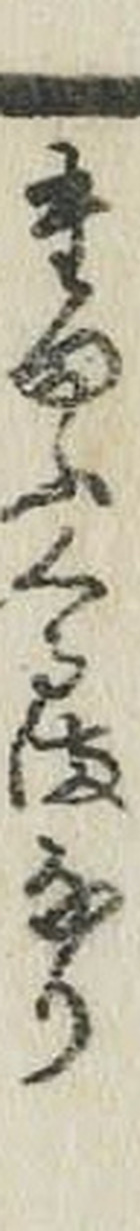たまふくるまなり
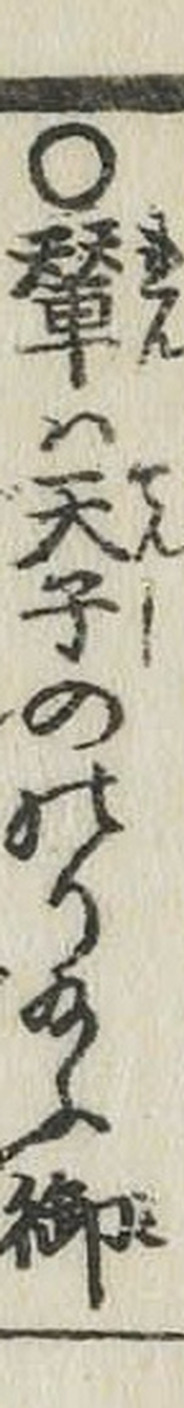○輦は天子ののり給ふ御
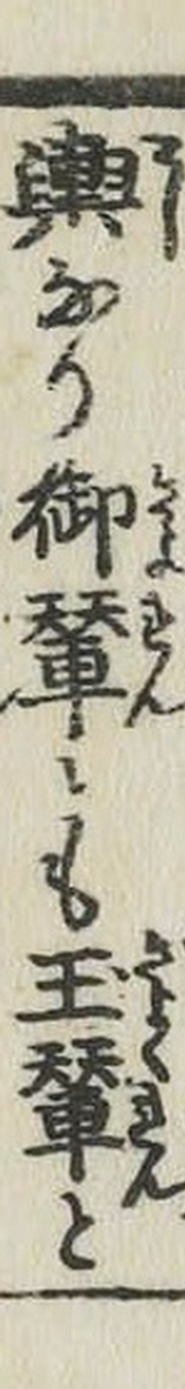輿なり御輦とも玉輦と
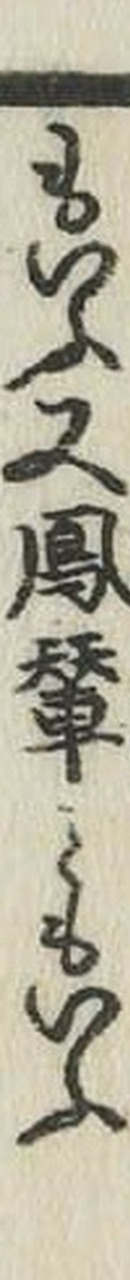もいふ又鳳輦ともいふ
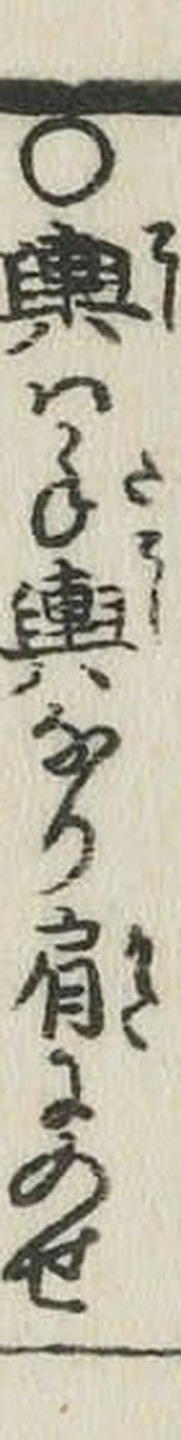○輿は手輿なり肩にのせ
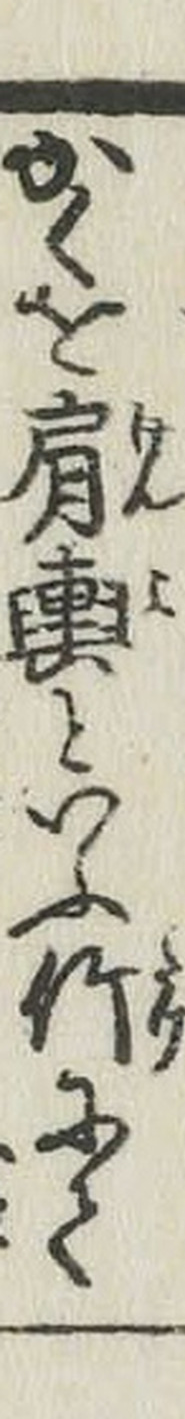かくを肩輿といふ竹にて
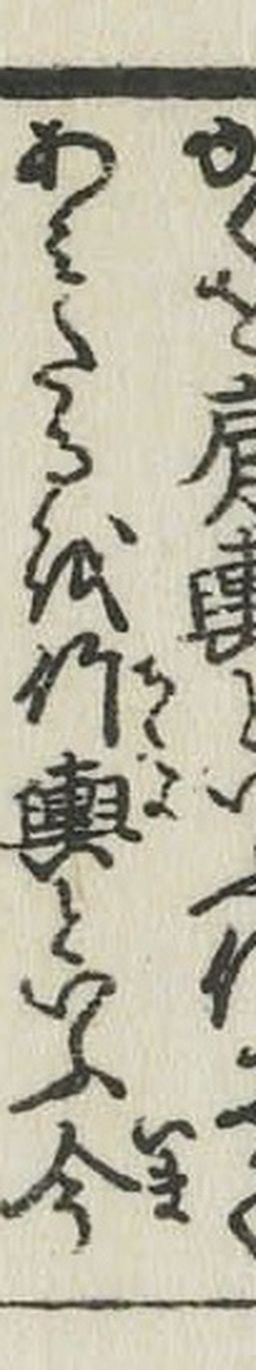あみたるを竹輿といふ今
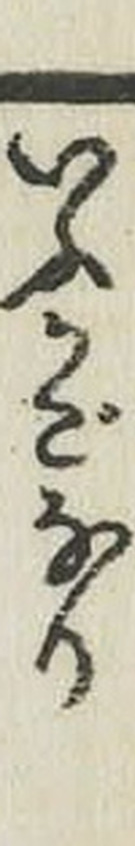いふかごなり
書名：増補頭書訓蒙図彙大成 10巻 5:巻之9-11
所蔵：東京学芸大学教育コンテンツアーカイブ
